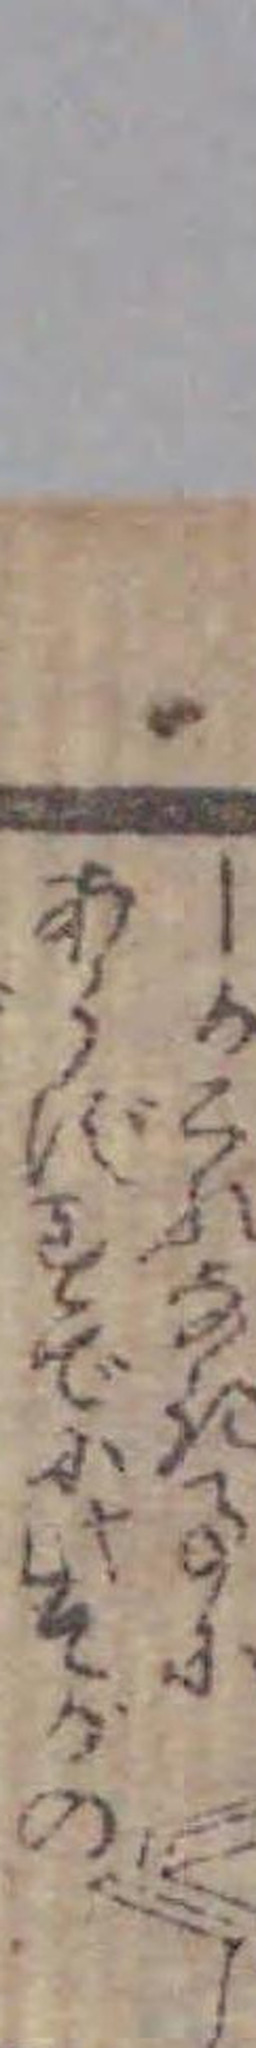あらずすでに此そがの
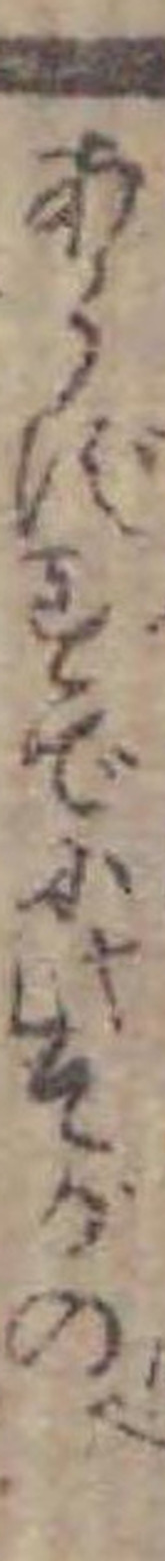あらずすでに此そがの
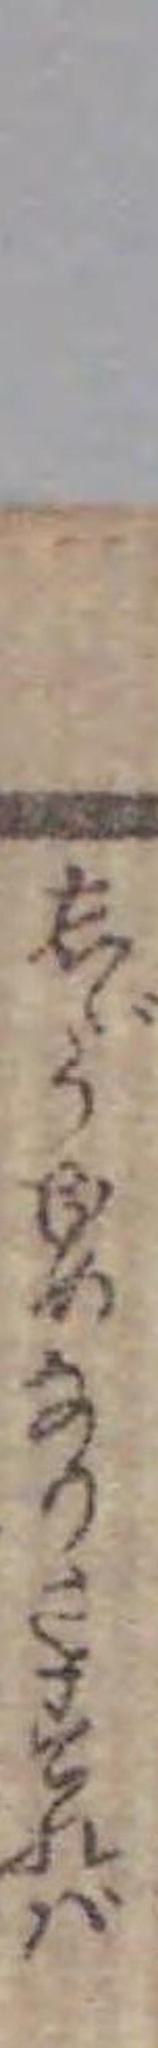しゞうゆめなりさすれば
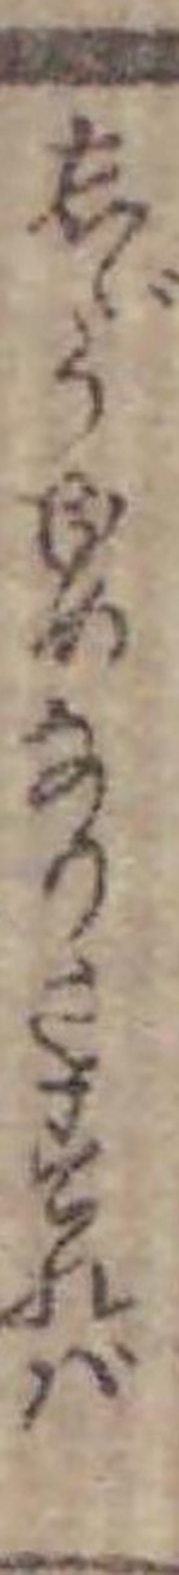しゞうゆめなりさすれば
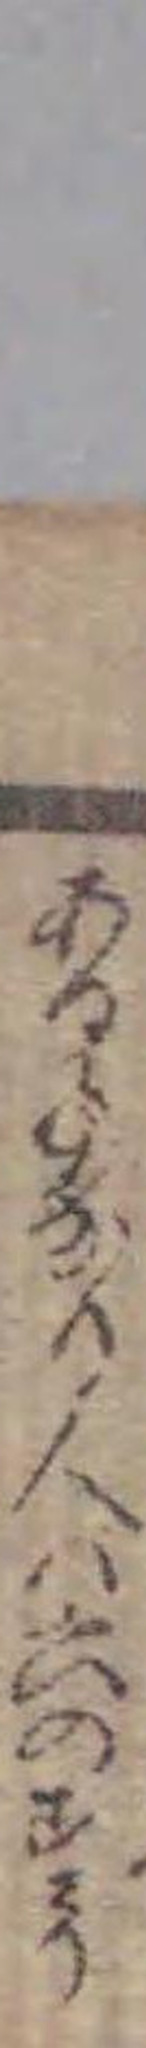ある事なり人は六のすう
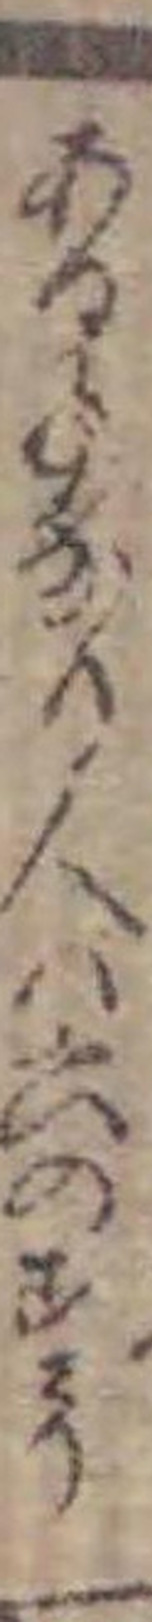ある事なり人は六のすう
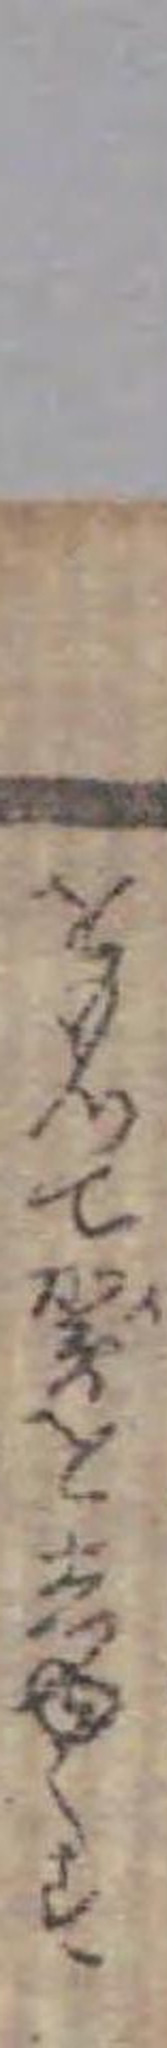をもつて賀をしゆくす
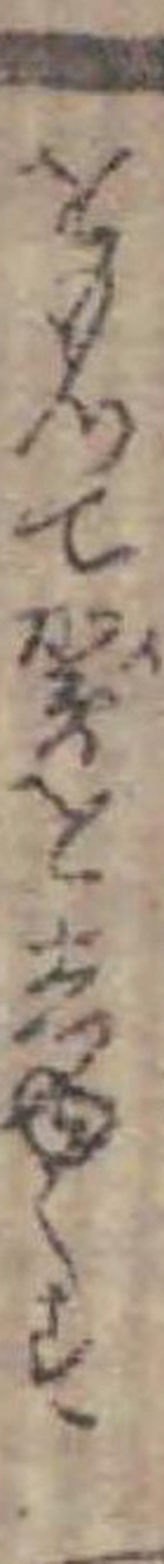をもつて賀をしゆくす
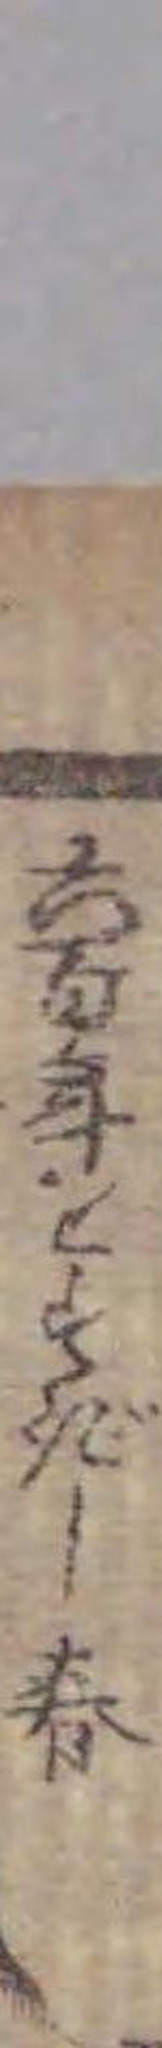六白年をすぎし春
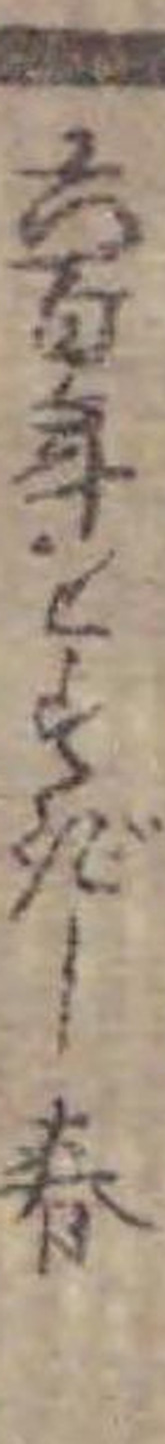六白年をすぎし春
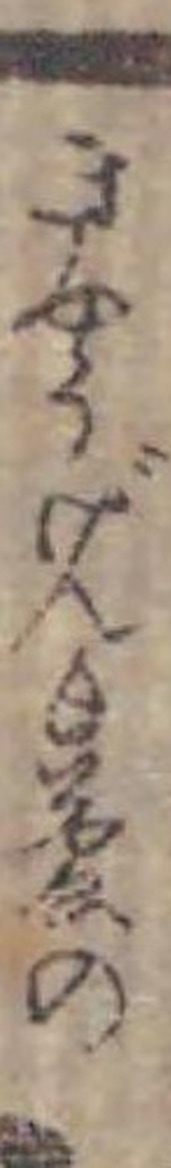きやうげんも夢の
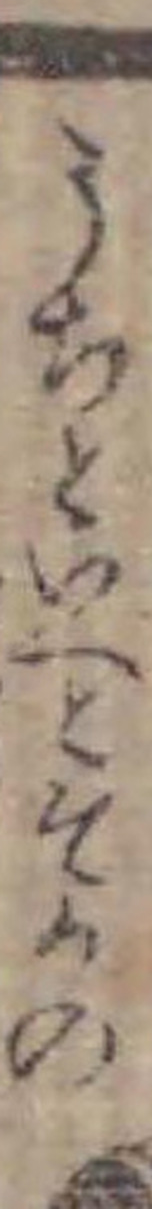うちといへとそかの
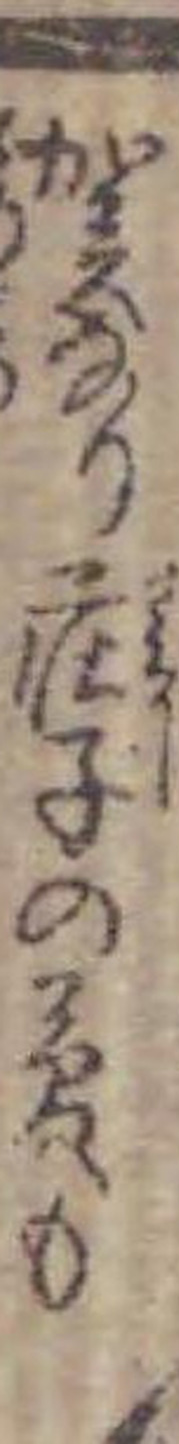賀なり荘子の夢も
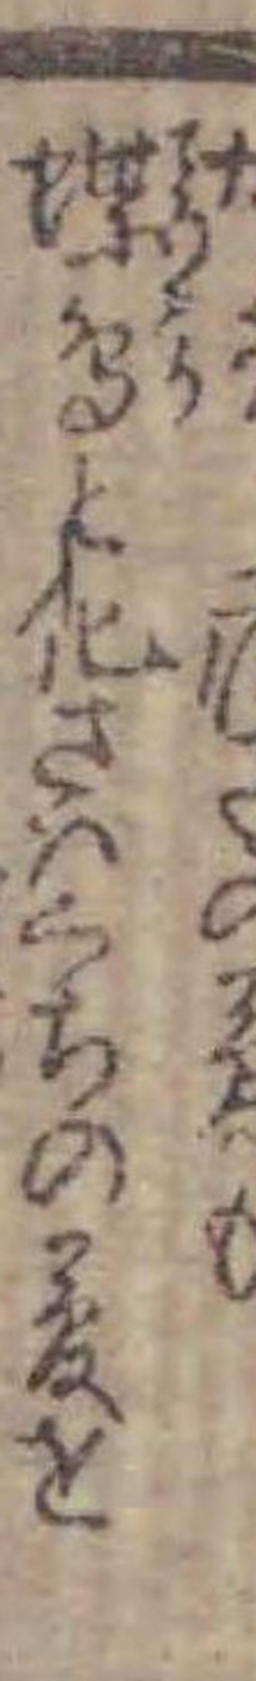蝶鳥と化さはくちの夢を
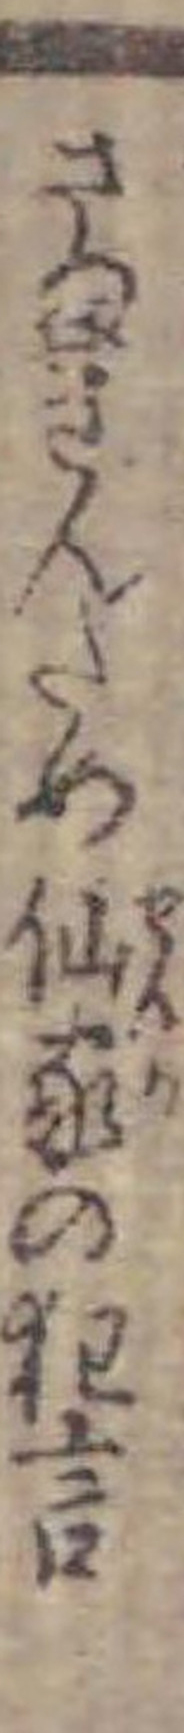さまさんため仙家の狂言
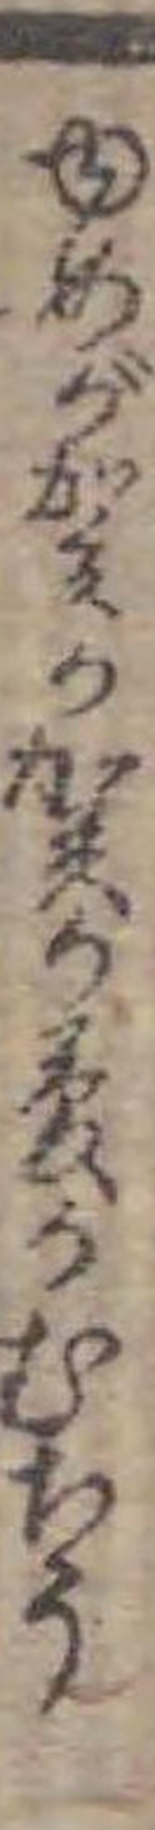ゆめが賀か賀か夢かむちう
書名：年寄之冷水曽我 : 3巻
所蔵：国立国会図書館 National Diet Library, JAPAN
